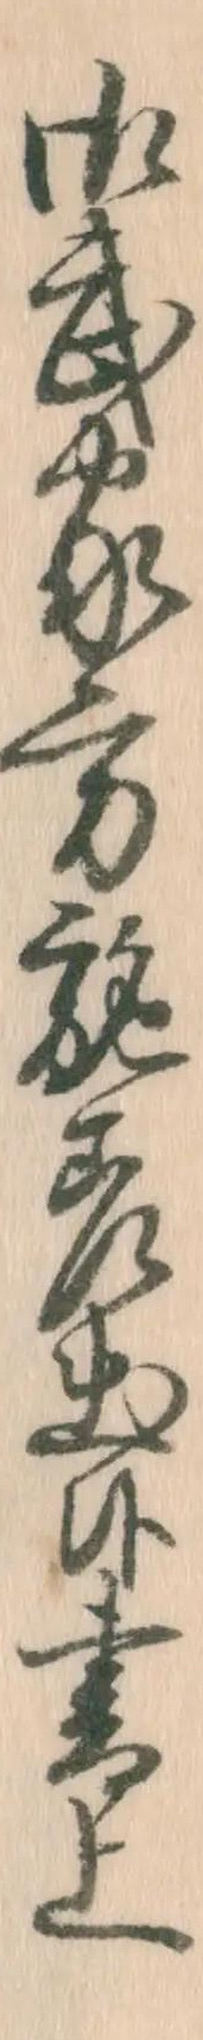御武家方施差出候書上
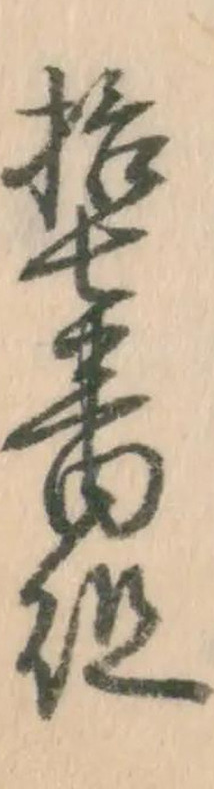拾七番組

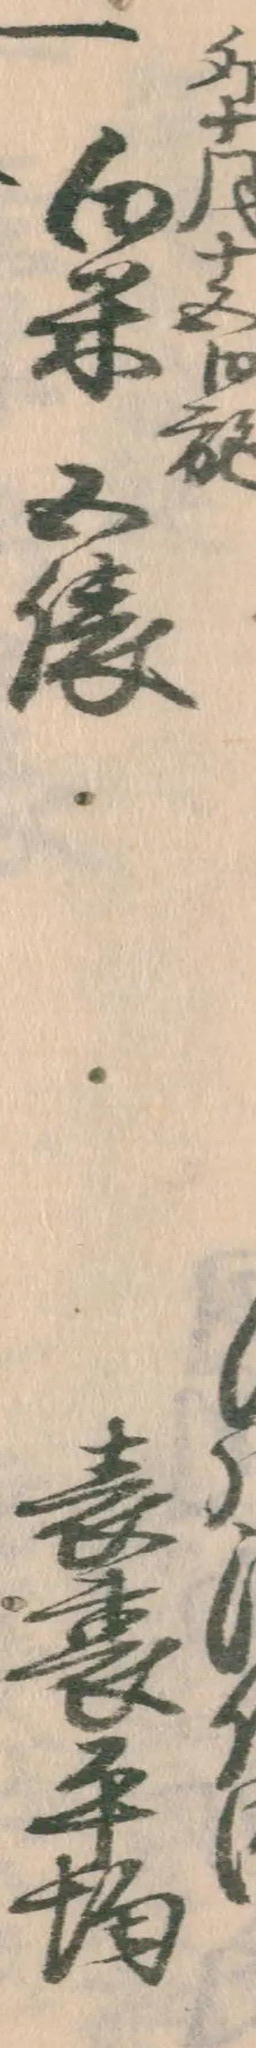一白米六俵表裏平均
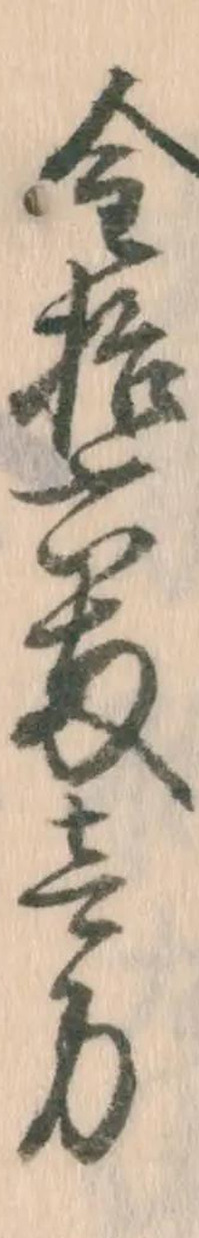金拾六両壱分
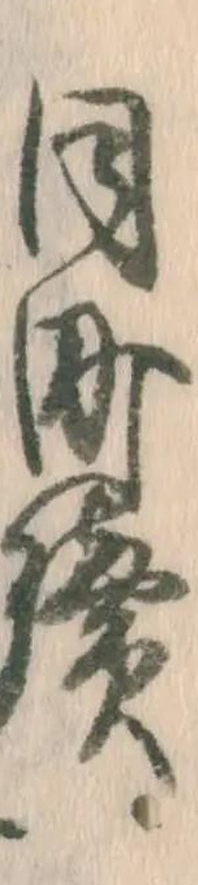同町続
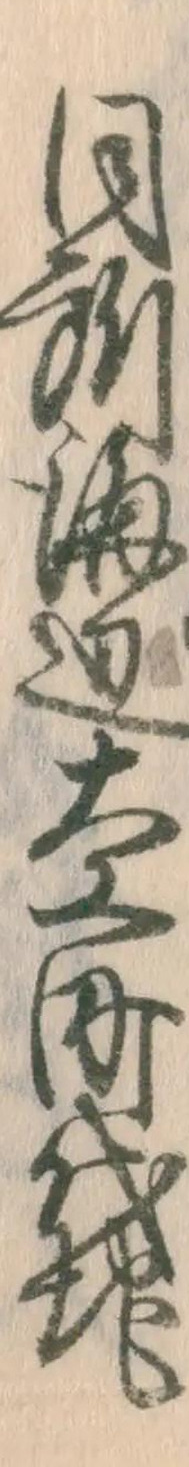同断同所海辺大工町代地
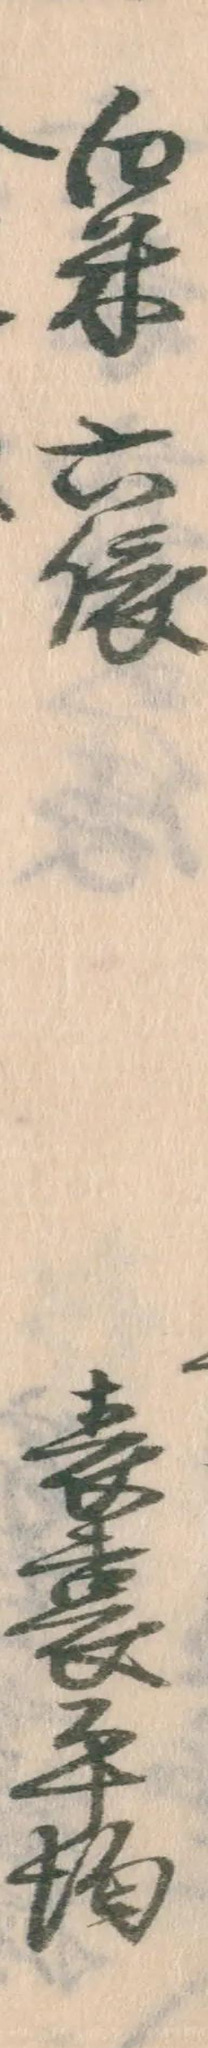一白米六俵表裏平均
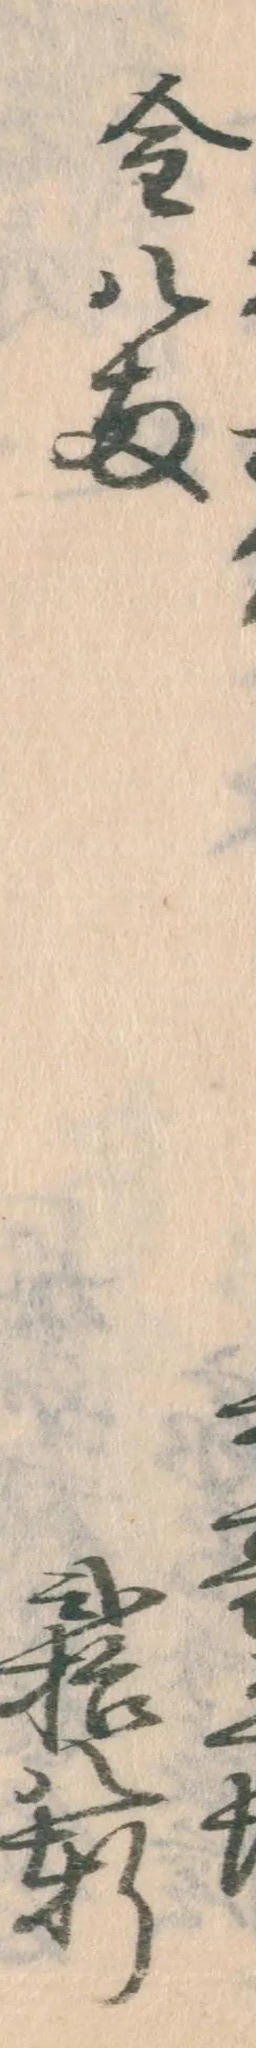金八両弐拾八軒
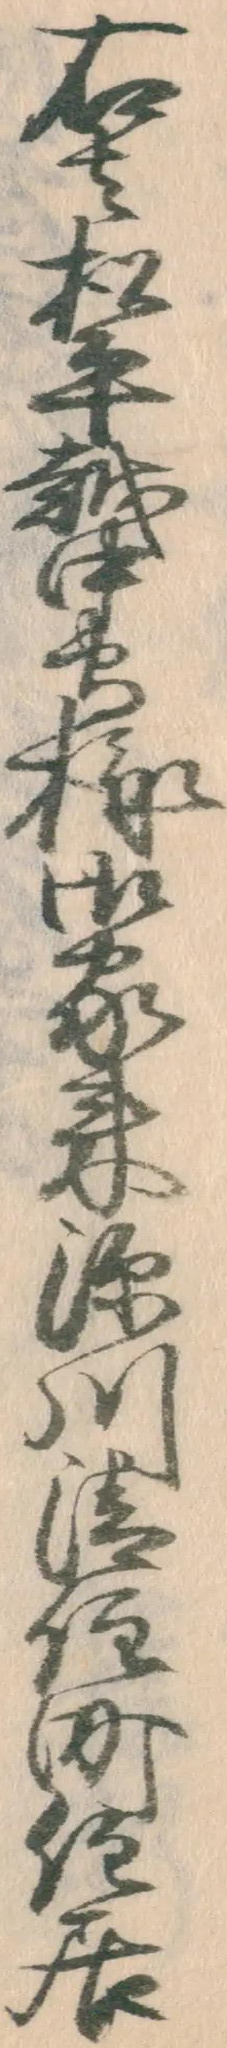右は松平越中守様御家来深川清住町住居

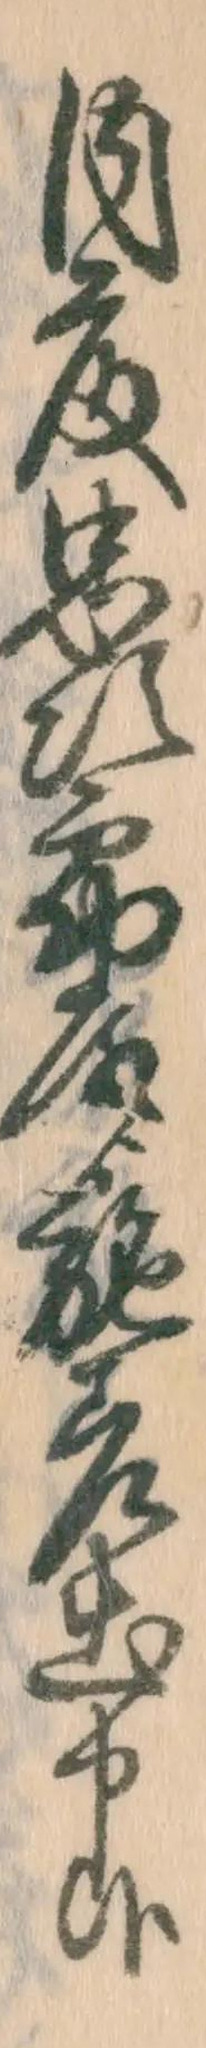内藤忠次郎殿ゟ施差出申候
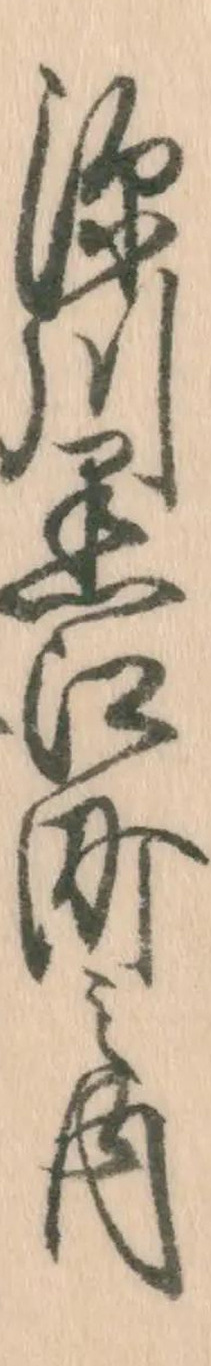深川黒江町之内
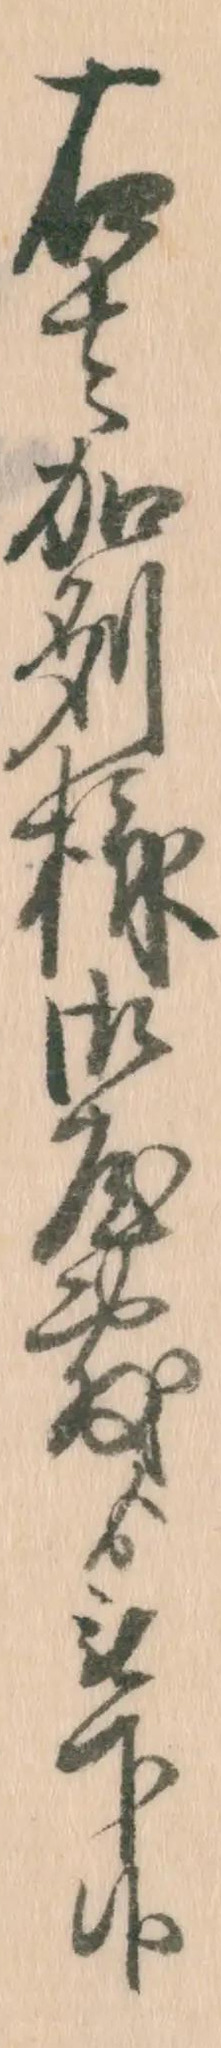右は加州様御屋敷ゟ被下候
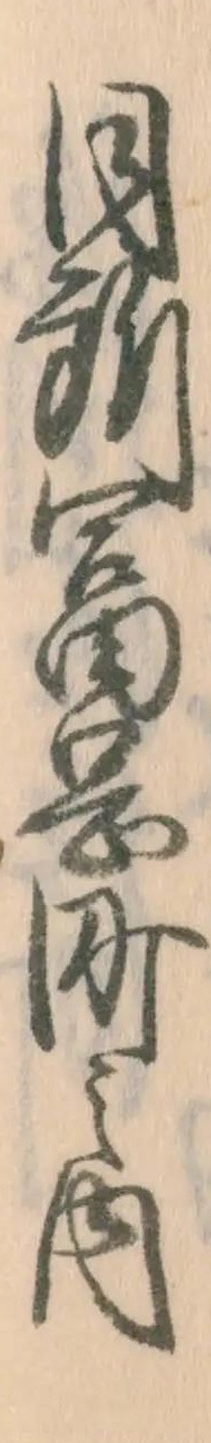同所冨岡町之内
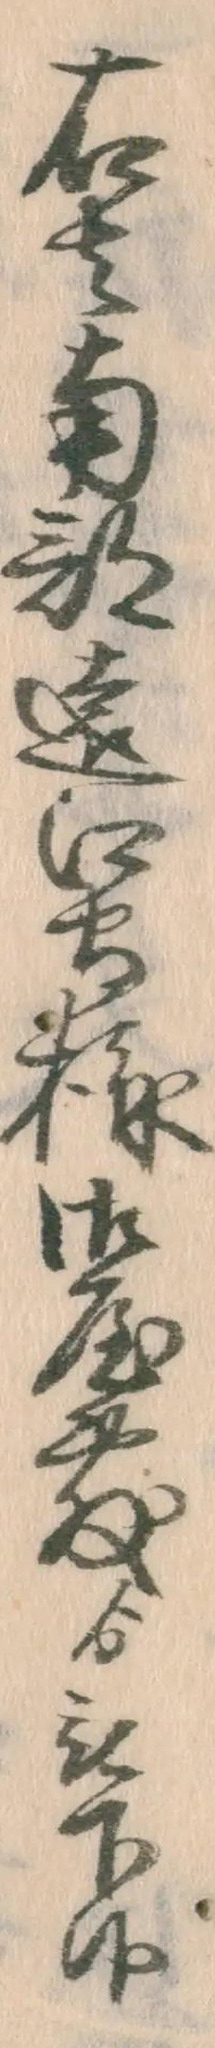右は南部遠江守様御屋敷ゟ被下候
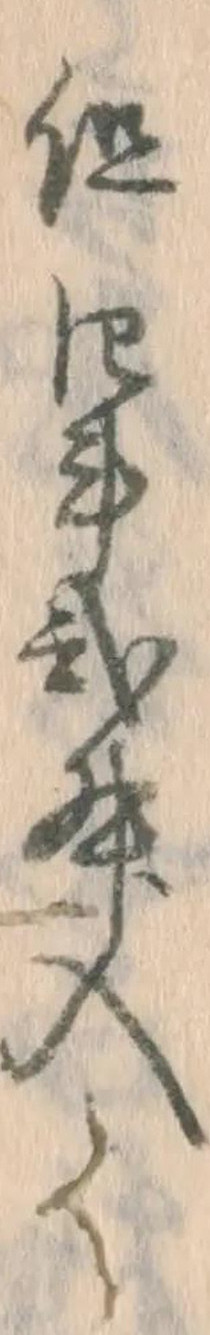但四斗弐升入

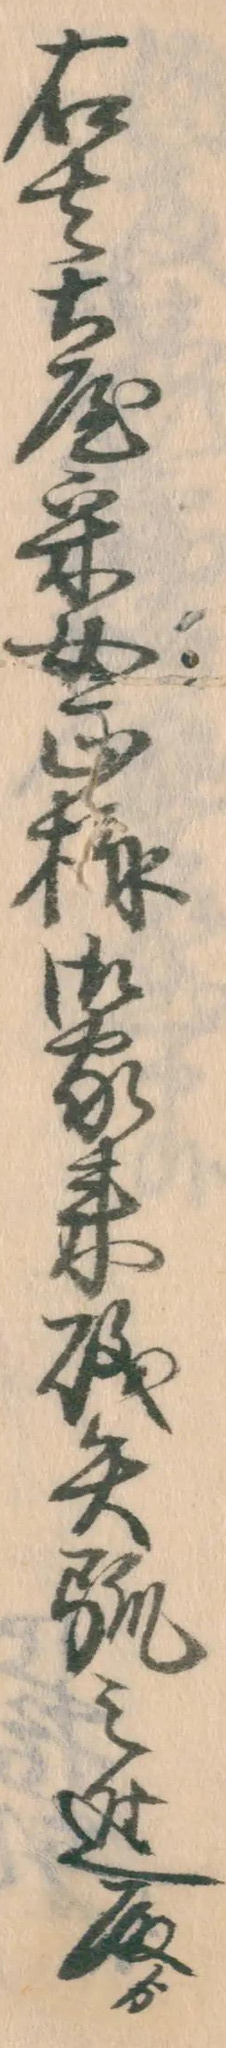右は土屋釆女正様御家来磯矢弧之進殿ゟ
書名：武家方并寺院等ニテ施差出候一件
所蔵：国立国会図書館 National Diet Library, JAPAN
